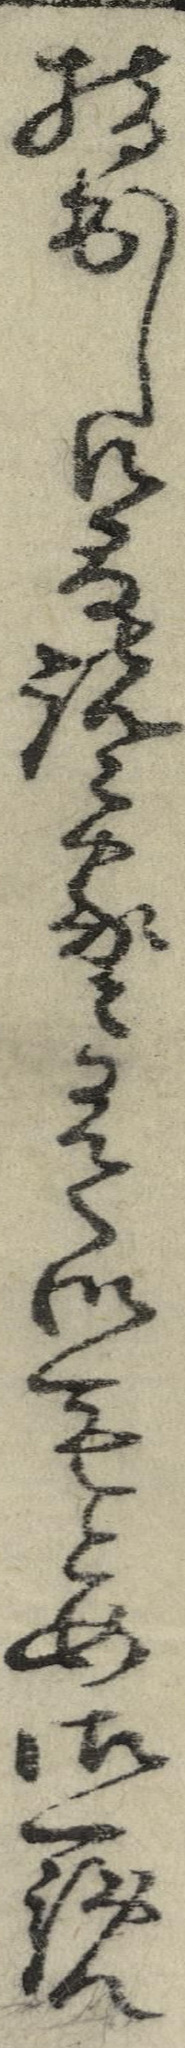指出し候間諸々家々にて御もとめ御一覧
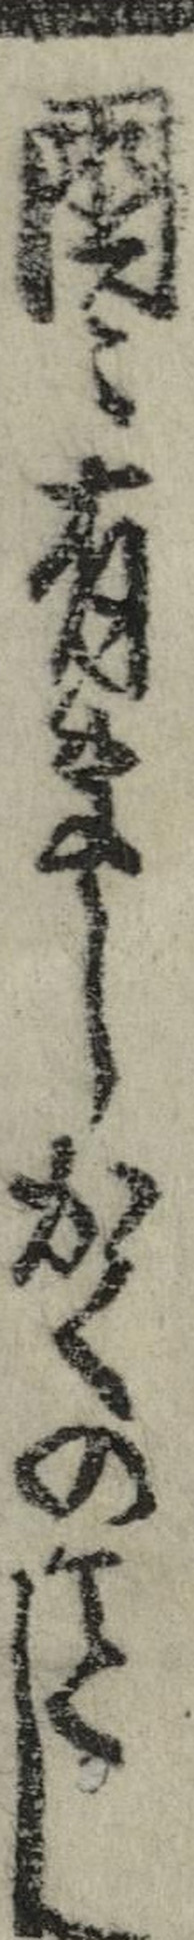聞ニ有ましかくのことし
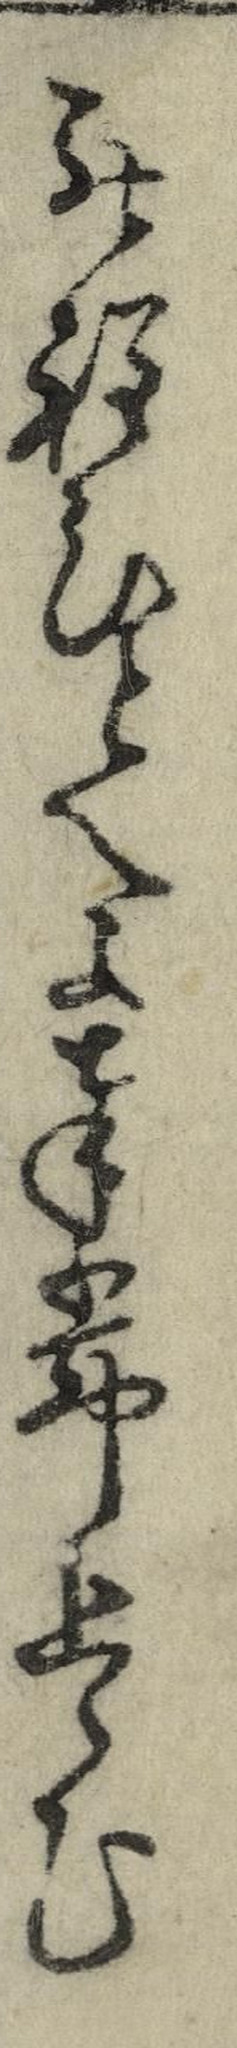候程ひとへに奉希上候以上
